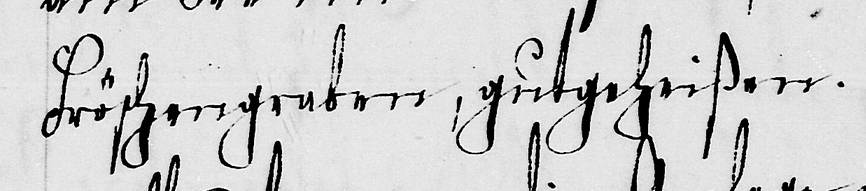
Fröschengraben, gutgeheißen.
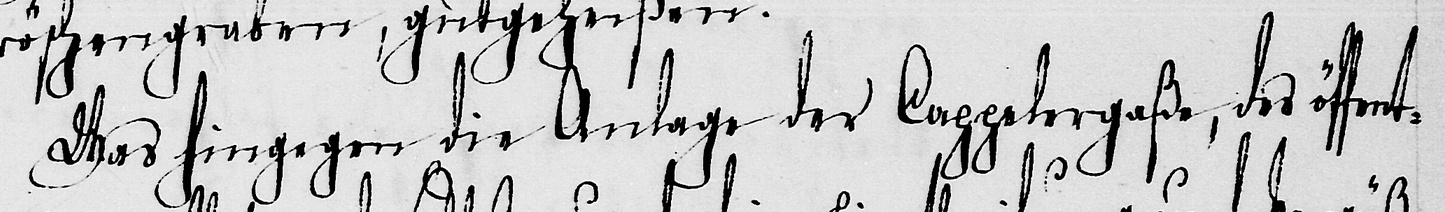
Was hingegen die Anlage der Cappelergaße, des öf¬
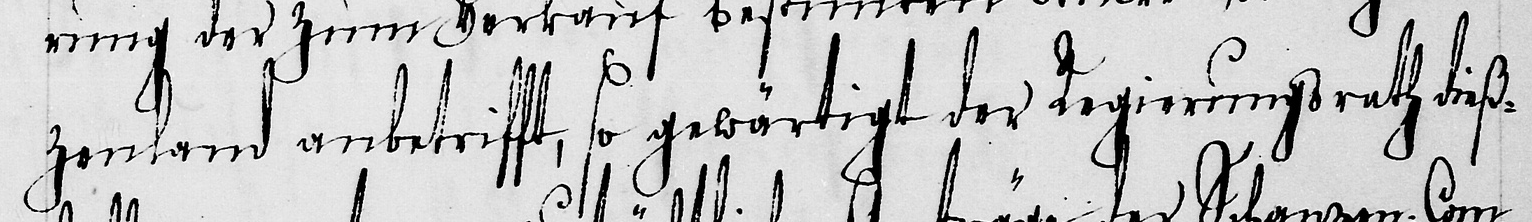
zenland anbetrifft, so gewärtigt der Regierungsrath dieß¬
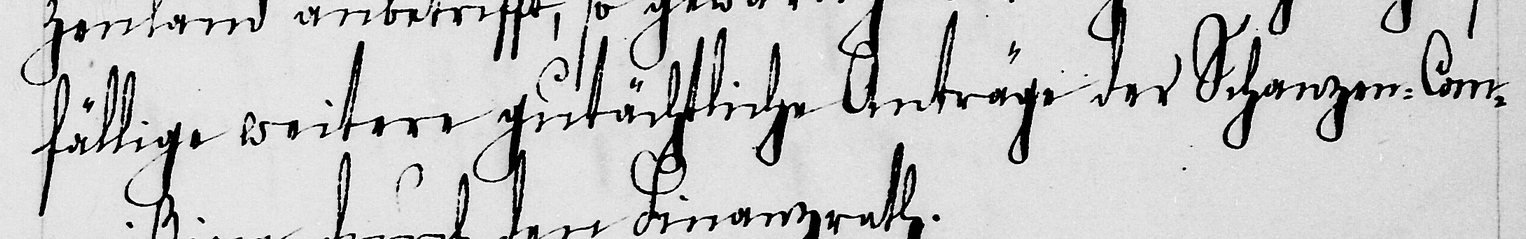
fällige weitere gutächtliche Anträge der Schanzen-Com¬
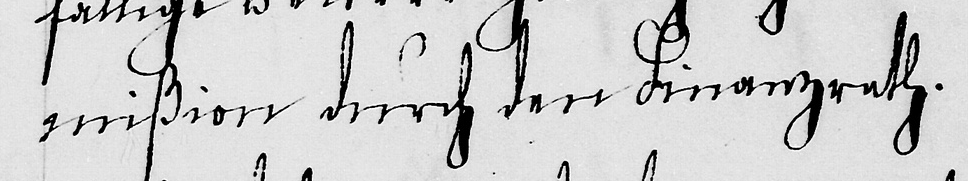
mißion durch den Finanzrath.
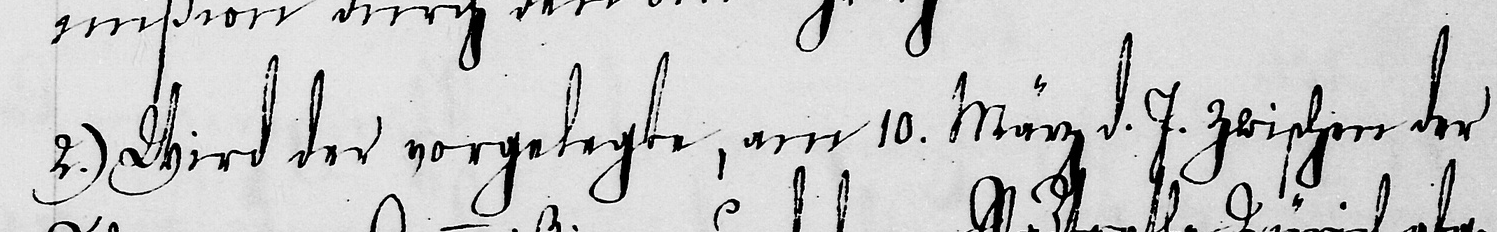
2.) Wird der vorgelegte, am 10. März d. J. zwischen der
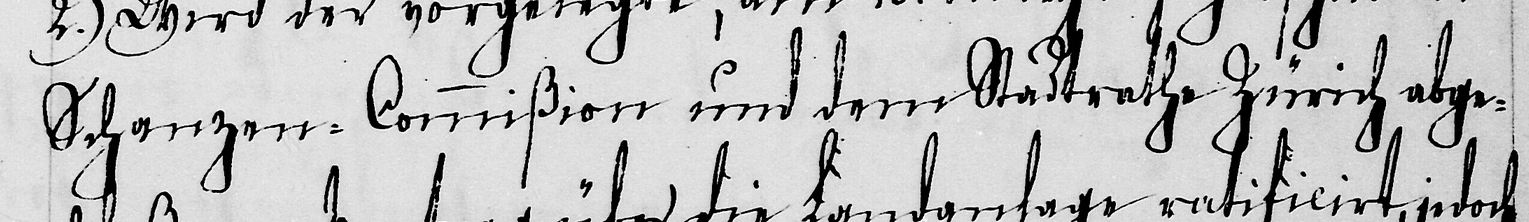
Schanzen-Commißion und dem Stadtrathe Zürich abge¬
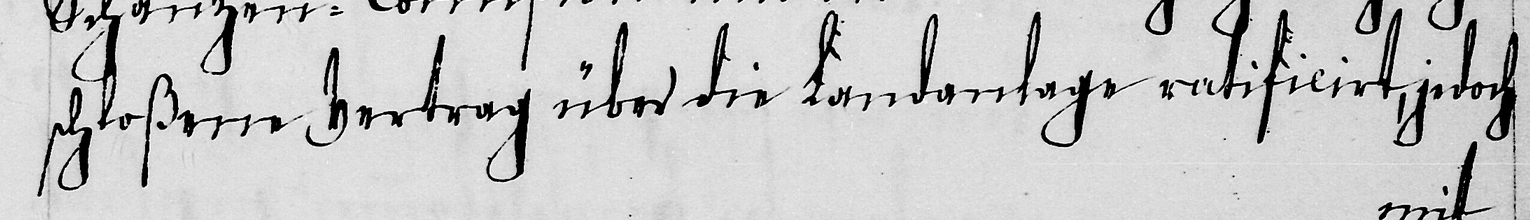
schloßene Vertrag über die Landanlage ratificirt, jedoch
